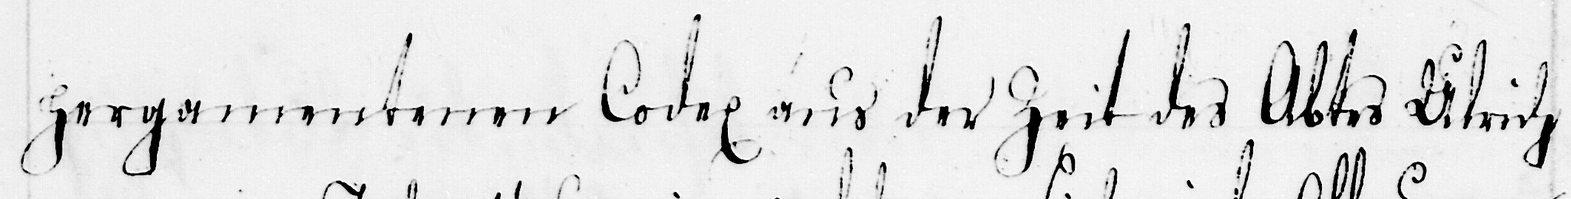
pergamentenen Codex aus der Zeit des Abtes Ulrich
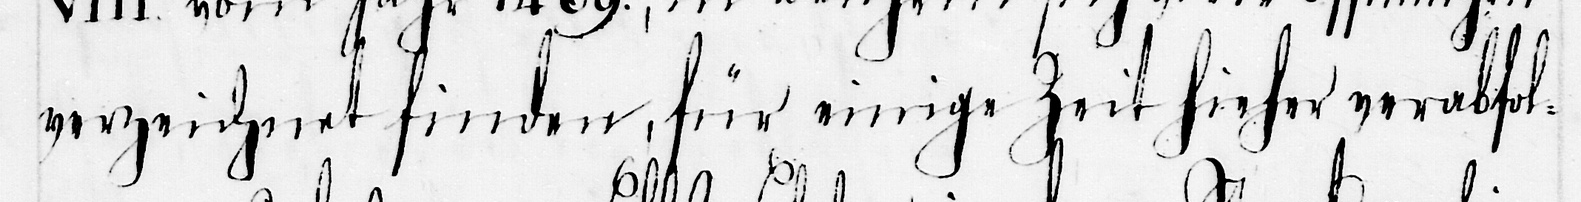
verzeichnet finden, für einige Zeit hieher verabfol¬
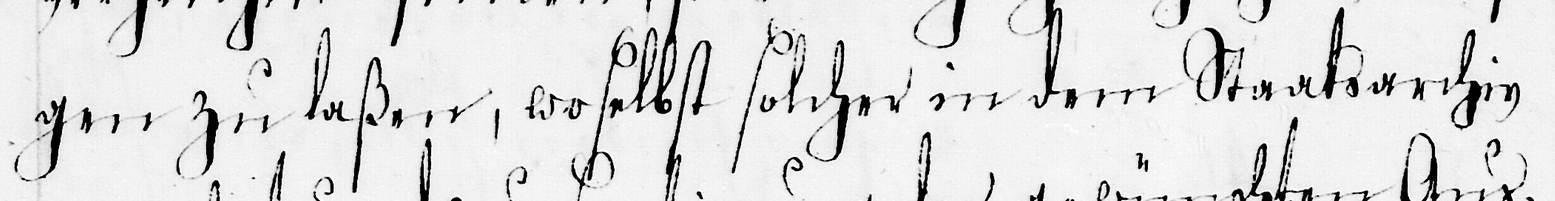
gen zu laßen, woselbst solcher in dem Staatsarchiv
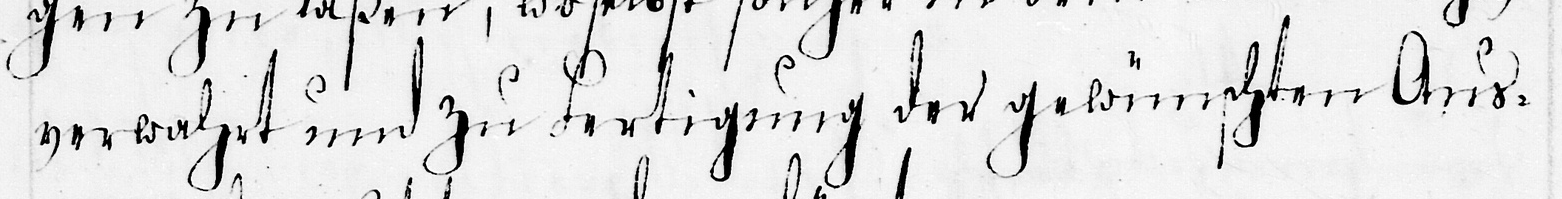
verwahrt und zu Fertigung der gewünschten Aus¬
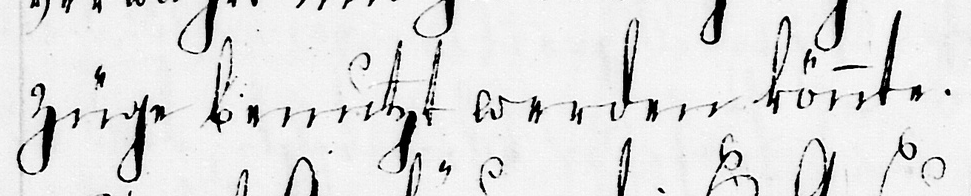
züge benutzt werden könnte.
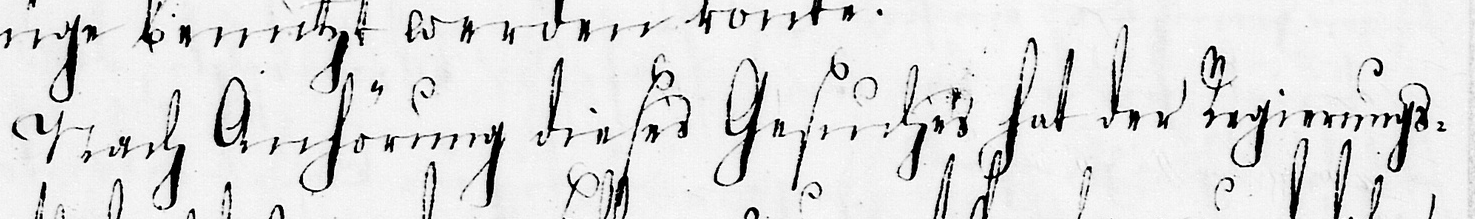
Nach Anhörung dieses Gesuches hat der Regierungs¬
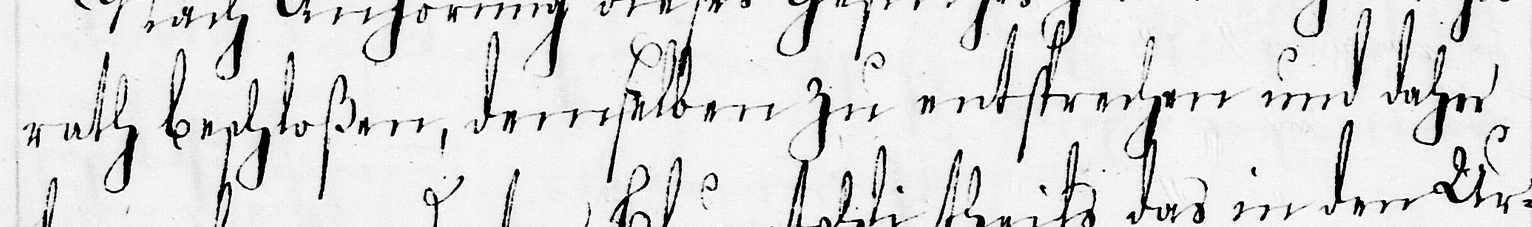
rath beschloßen, demselben zu entsprechen und daher
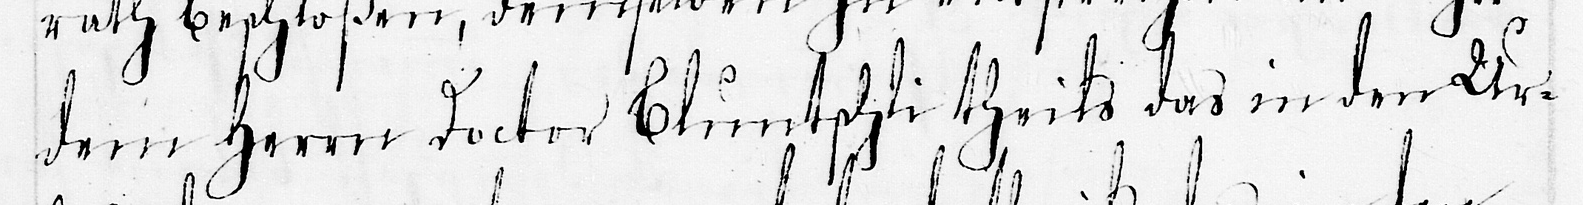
dem Herrn Doctor Bluntschli theils das in den Ur¬
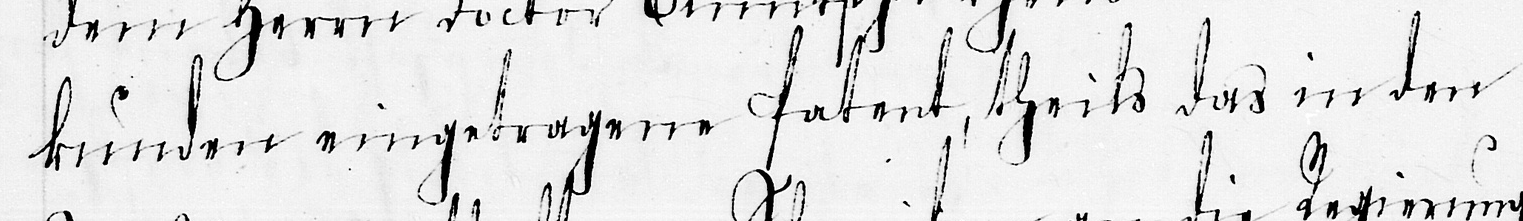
kunden eingetragene Patent, theils das in den
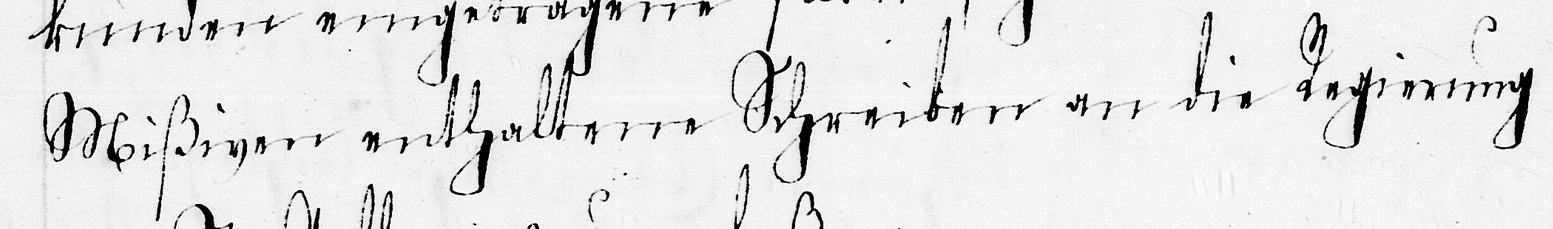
Mißiven enthaltene Schreiben an die Regierung
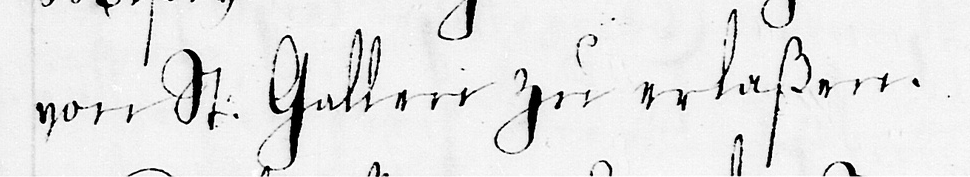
von St. Gallen zu erlaßen.
